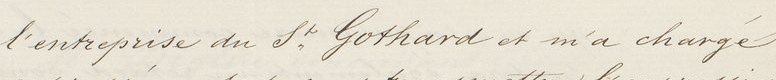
l'entreprise du St Gothard et m'a chargé
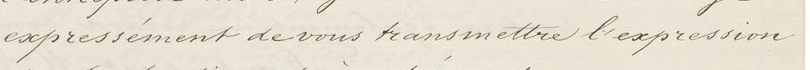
expressément de vous transmettre l'expresssion
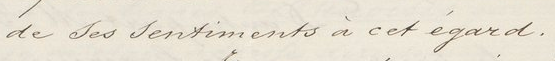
de ses sentiments à cet égard.
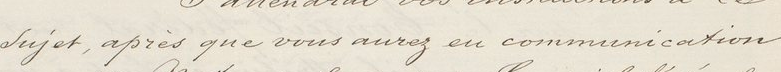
sujet, après que vous aurez eu communication
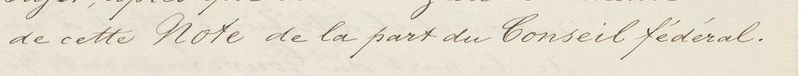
de cette Note de la part du Conseil Fédéral.
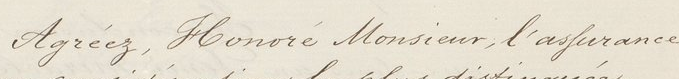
Agréez, Honoré Monsieur, l'assurance
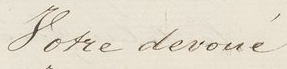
Votre devoué
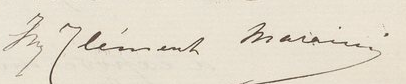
Ing Clément Maraini
